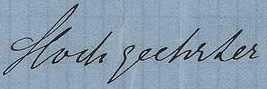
Hochgeehrter
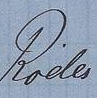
Abend
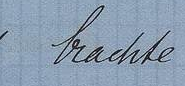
brachte
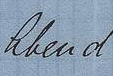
Herr v.
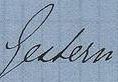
die neue
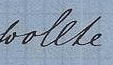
wollte
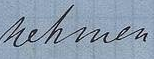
nicht nehmen
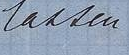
lassen Ihnen
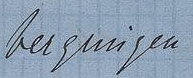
telegraphisch
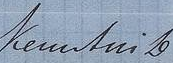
Kenntniss
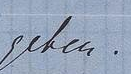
geben.
